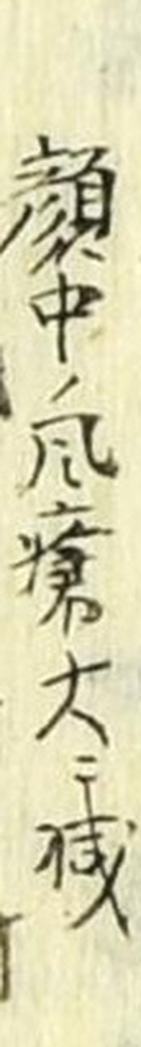同顔中ノ風瘡大ニ減
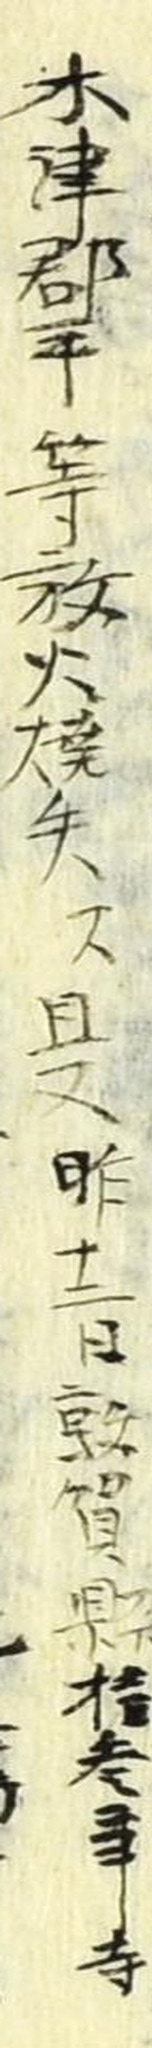木津郡平等放火焼失ス且又昨十二日敦賀県権参事寺
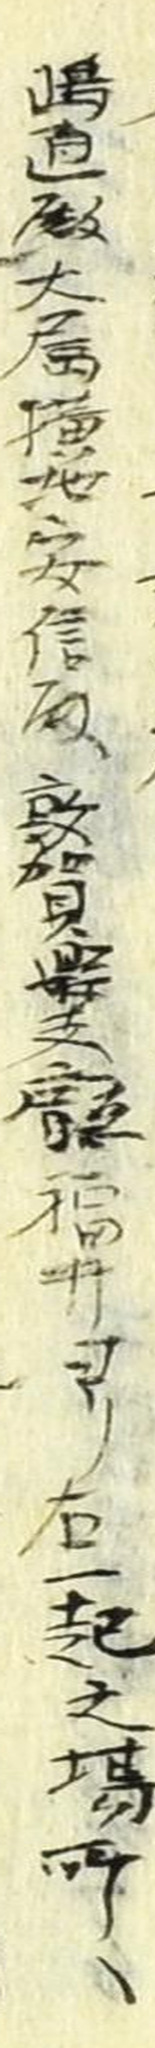島直殿大属横地安信殿敦賀県支庁福井ヨリ右一起之場所へ
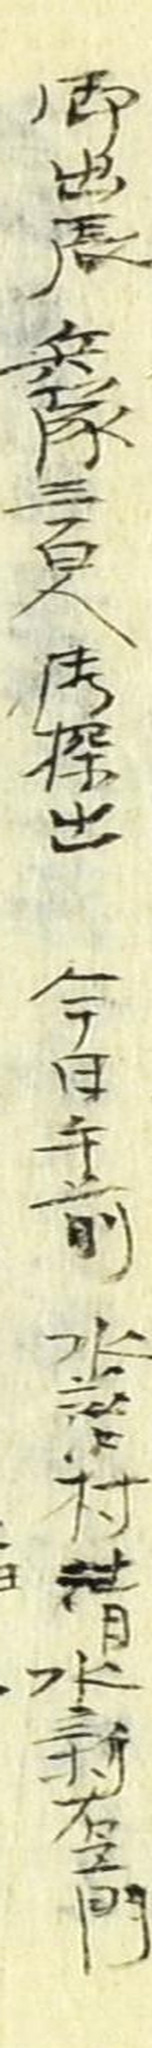御出張兵隊三百人御探出今日午前水落村清水新右衛門
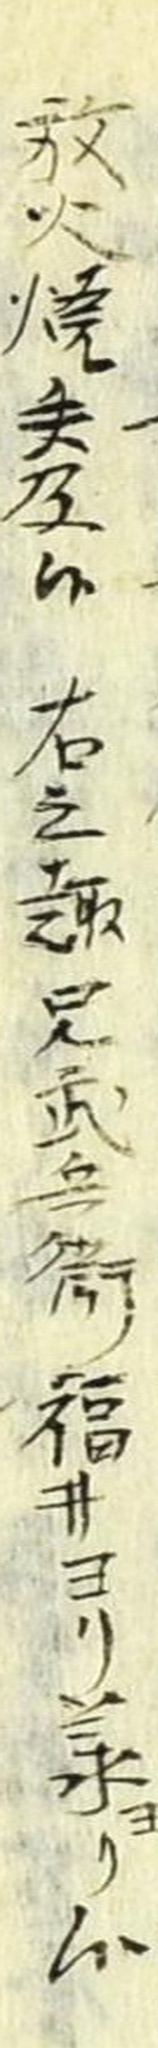放火焼失及候右之趣兄武兵衛福井ヨリ承ヨリ候
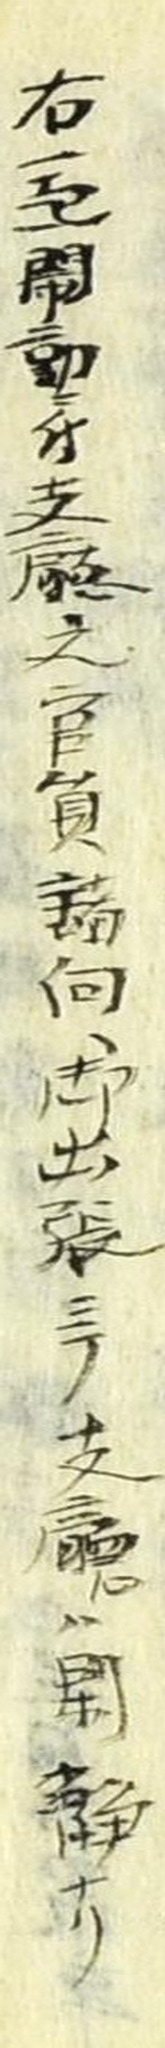右一起鬧動ニ付支庁之官員諸向へ御出張ニテ支庁ハ閑静ナリ
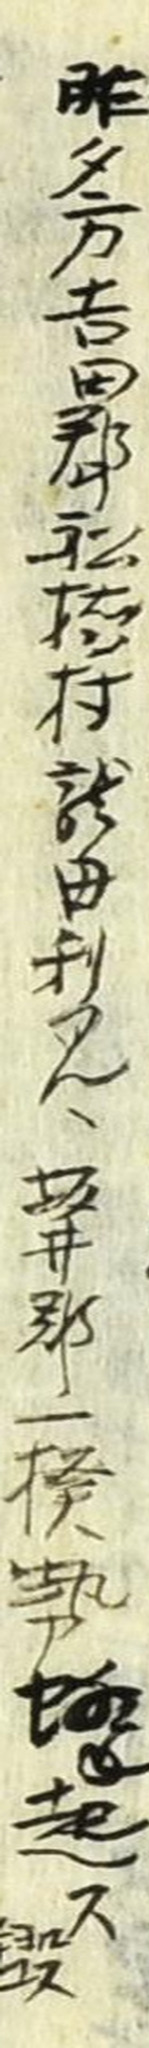昨夕方吉田郡船橋村龍田利見へ坂井郡一揆勢蜂起ス
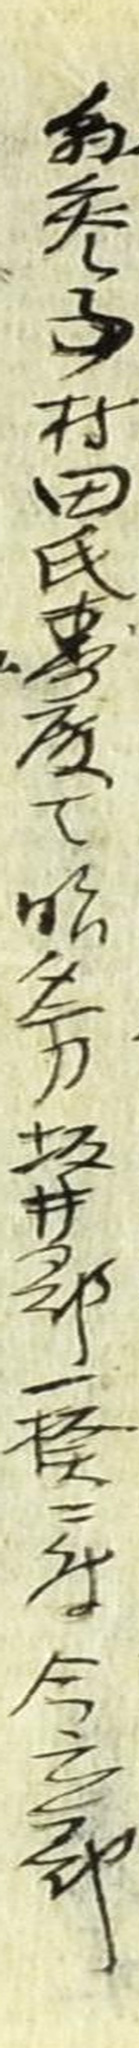県参事村田氏寿殿者昨夕方坂井郡一揆ニ付今立郡
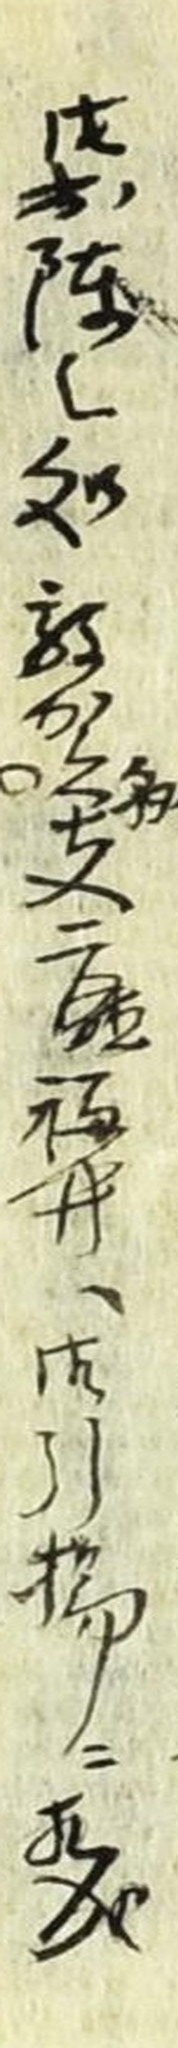御出陣之処敦賀「県」支庁福井へ御引揚ニ相成
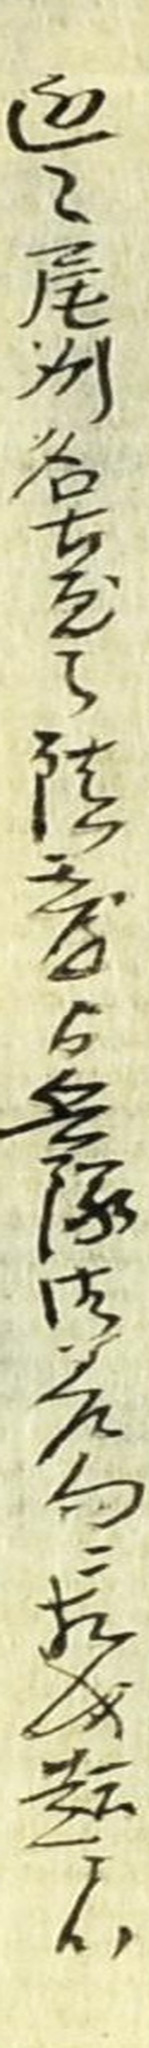近々尾州名古屋之鎮台ゟ兵隊御差向ニ相成趣ニ候
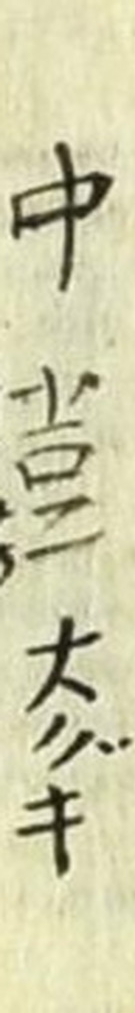中小豆大グキ
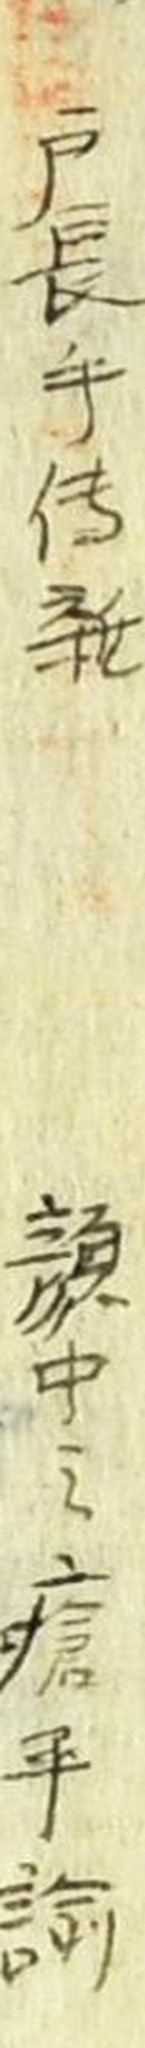戸長手伝雑顔中之瘡平諭
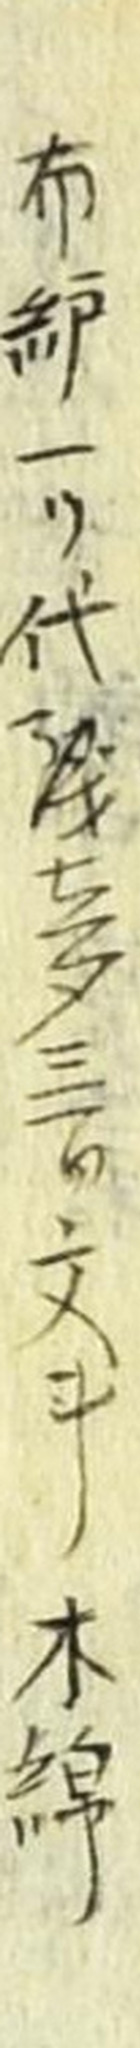布䋆一ツ代銭壱貫三百文計木綿
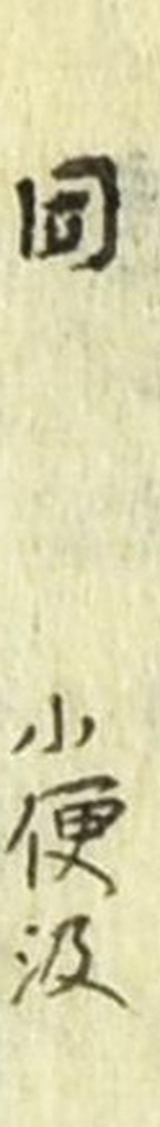同小便汲
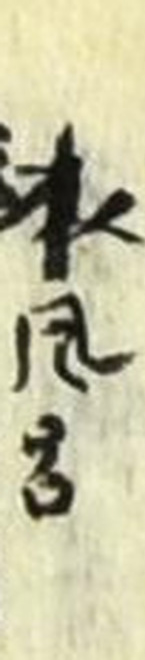水風呂

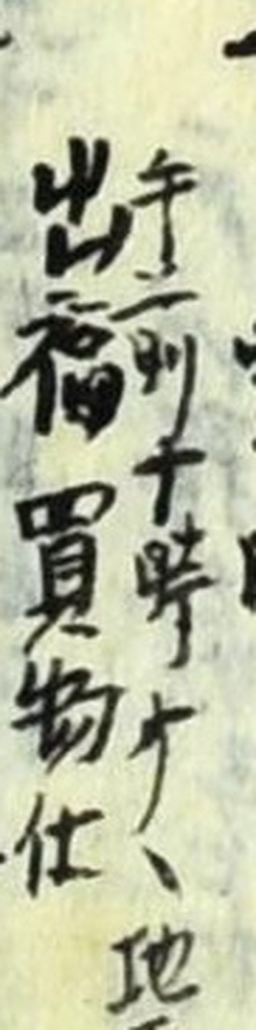出福買物仕
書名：（日記）
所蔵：福井県文書館 Fukui Prefectural Archives
